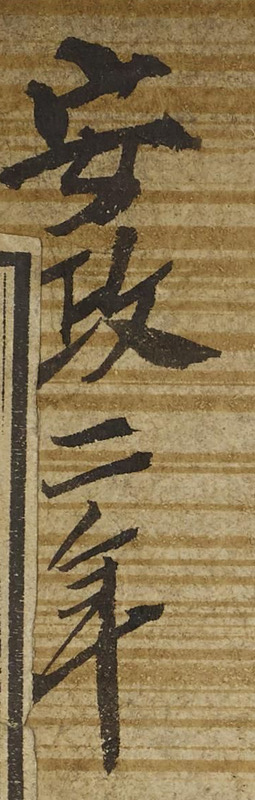安政二年
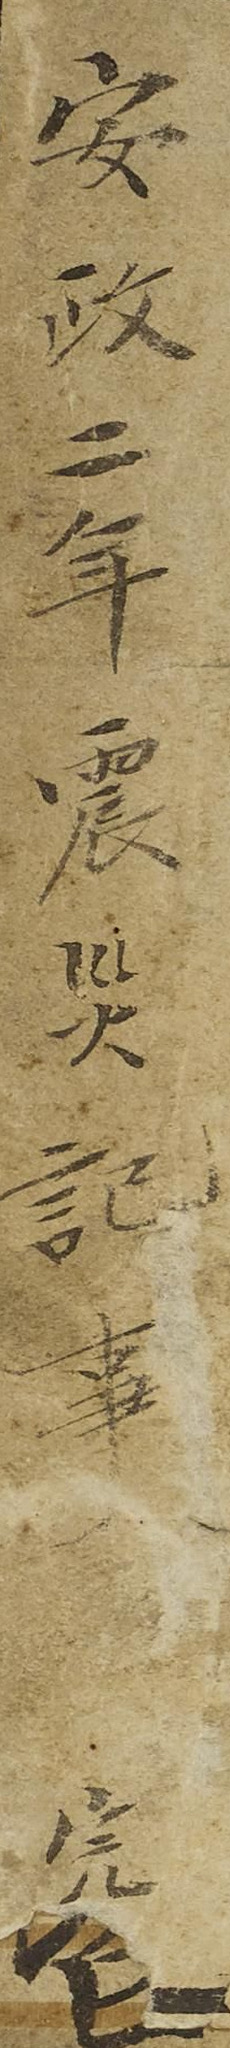安政二年震災記事完

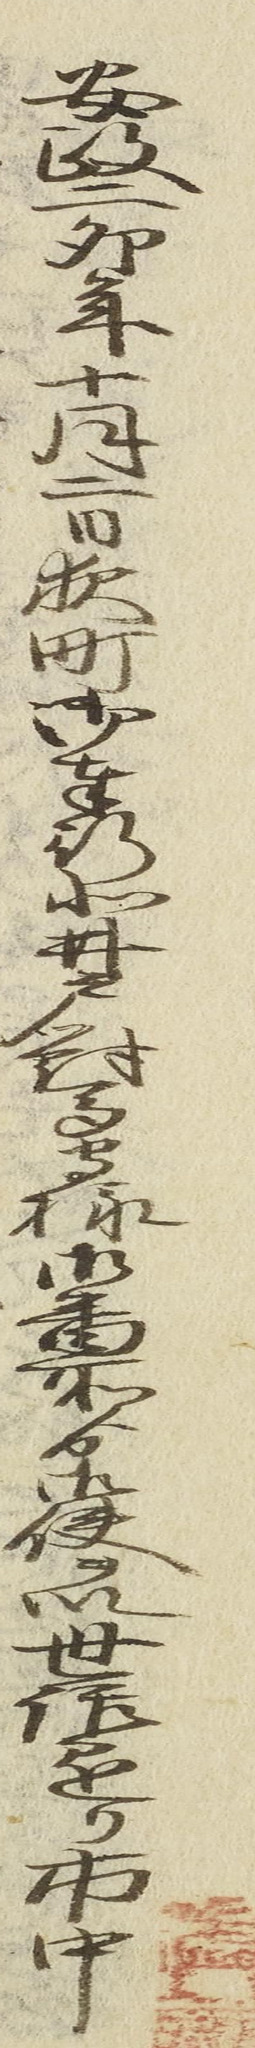一安政二卯年十月二日夜町御奉行北井戸対馬守様御番所ゟ御使ヲ以世話懸り市中
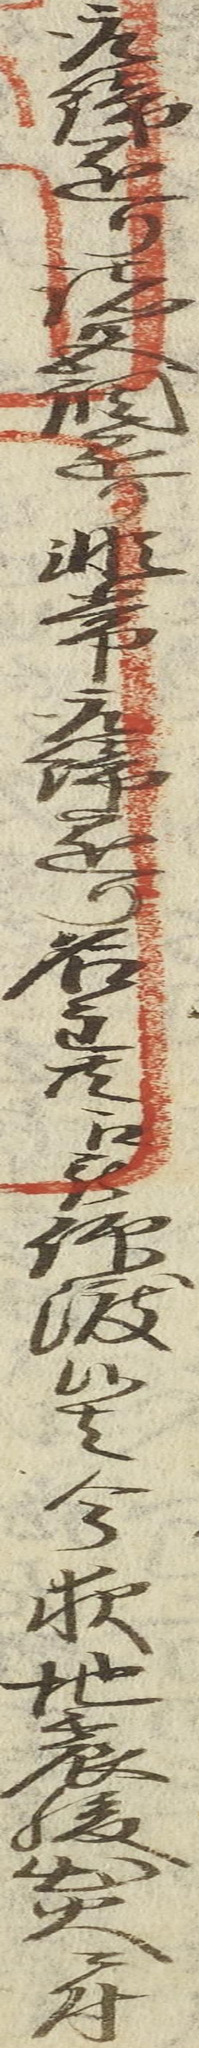取締懸り諸色調懸り非常取締懸り名主共江被仰渡候者今夜地震後出火ニ付
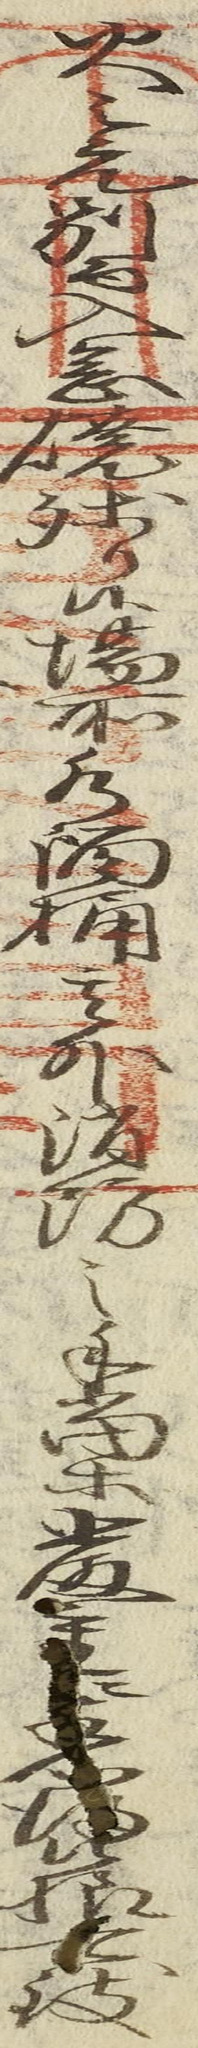火之元別而入念焼残り候場所水酒桶其外消防之手当等厳重ニ相心得候様可致
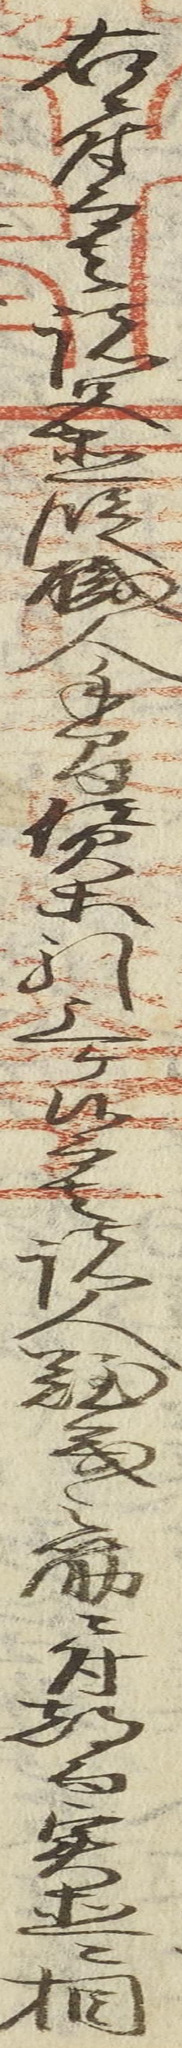右ニ付而者諸色直段職人手間賃等引上ケ候而者諸人難義之筋ニ付都而実直ニ相
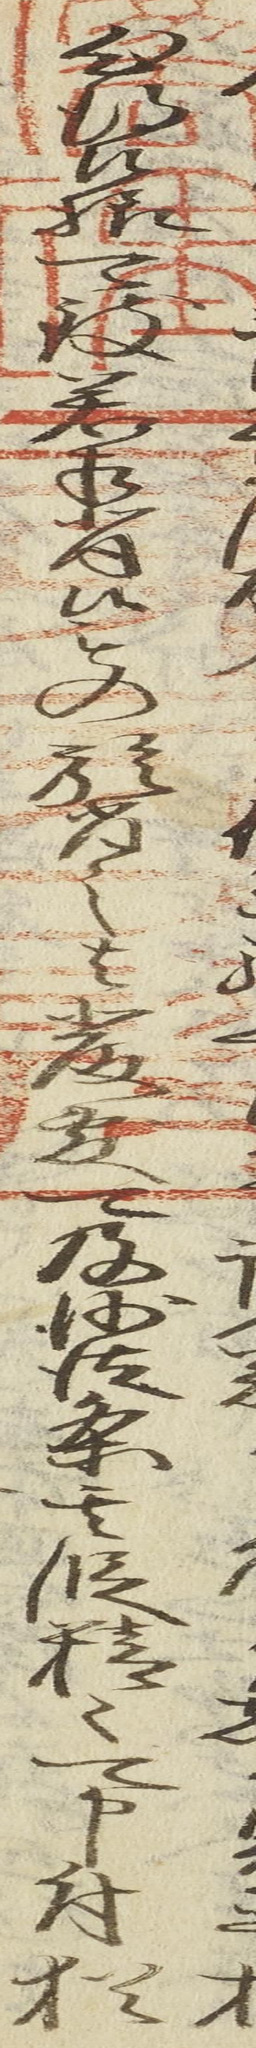心得候様可致若相背候もの於有之者厳敷可及沙汰条其段精々可申付猶
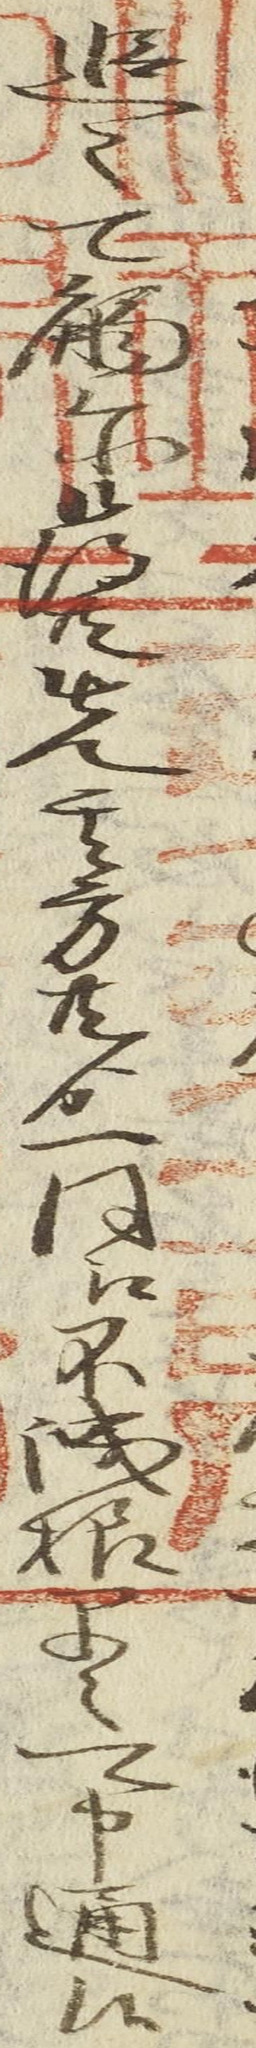追々可觸示候得共先其方共ゟ一同江不洩様早々可申通候
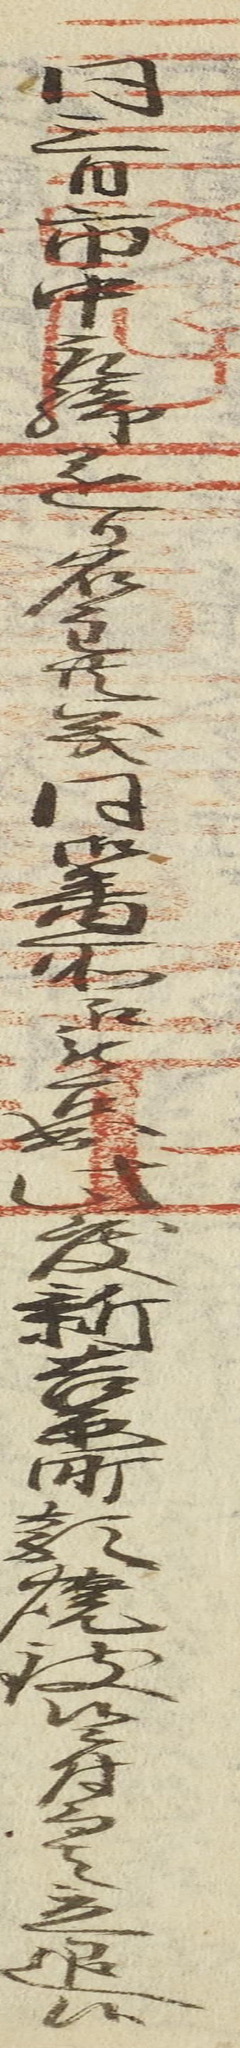一同三日市中取締懸り名主共義同御番所江被召出此度新吉原町類焼致候ニ付而者立退候
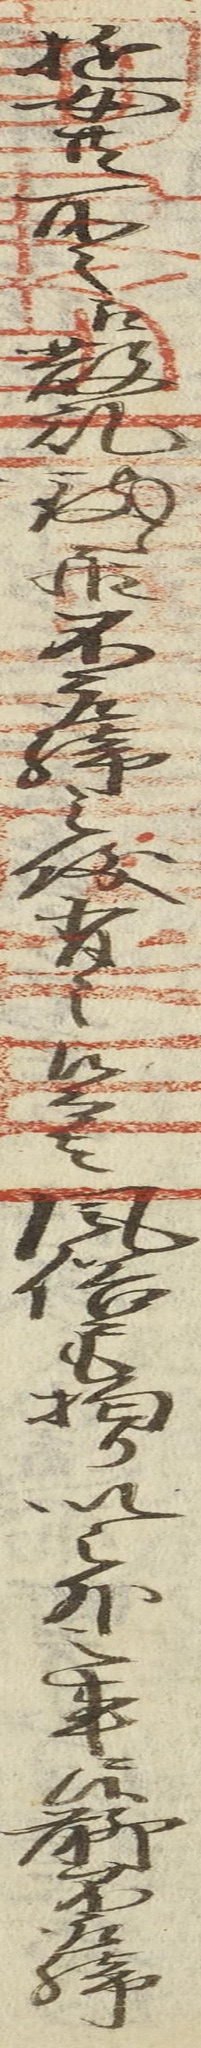遊女共所々江散乱致居不取締之儀有之候而者風俗ニも拘り以之外之事ニ候聊不取締
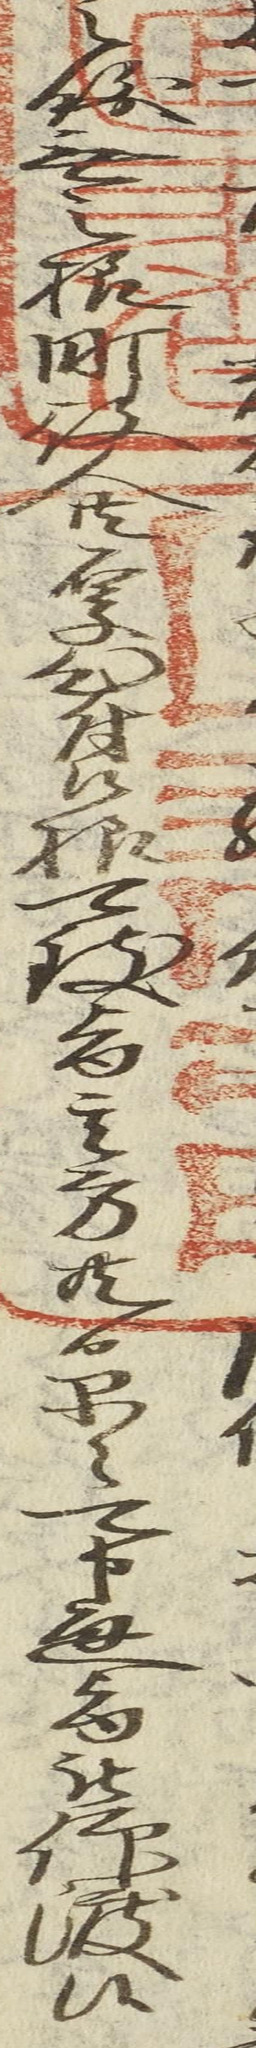之儀無之様町役人共厚心付候様可致旨其方共ゟ早々可申通旨被仰渡候
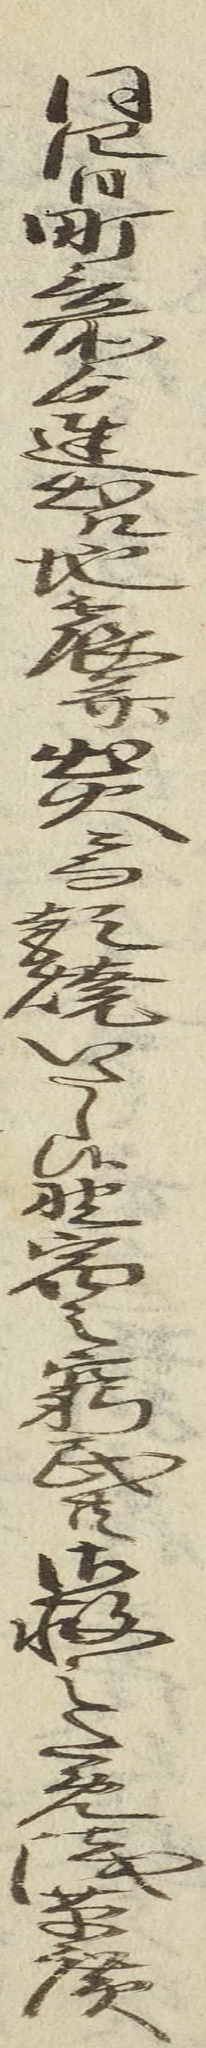一同四日町会所ゟ達出ル地震幷出火ニ而類焼いたし候野宿之窮民共御救之ため浅草広
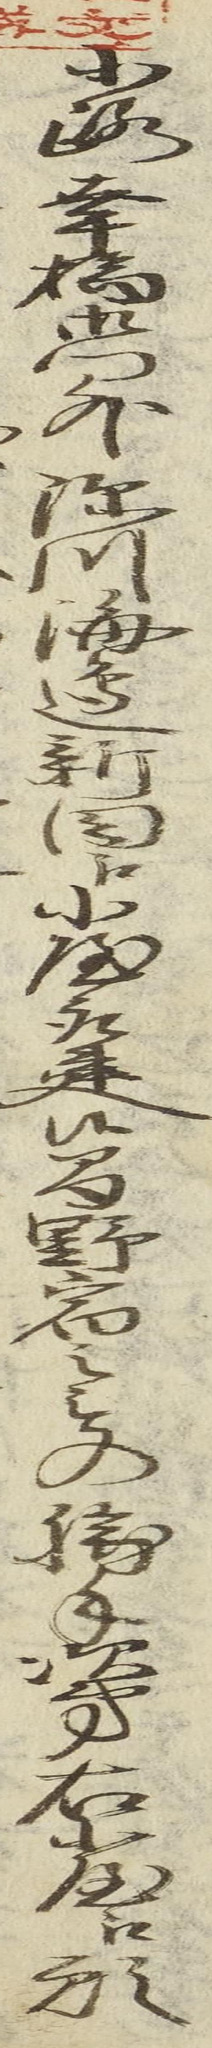小路幸橋御門外深川海辺新田江小屋取建候間野宿之もの勝手次第右小屋江願
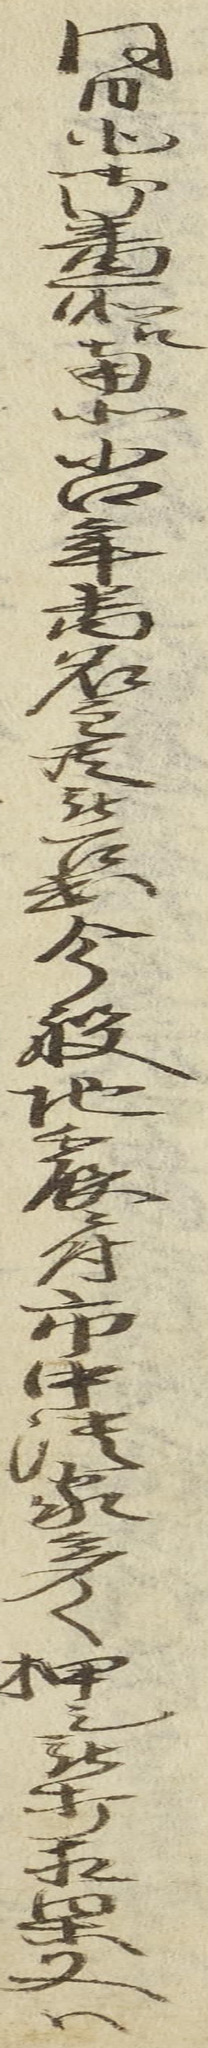一同日北御番所江南北小口年番名主共被召出今般地震ニ付市中潰家多く推シ被打相果又は
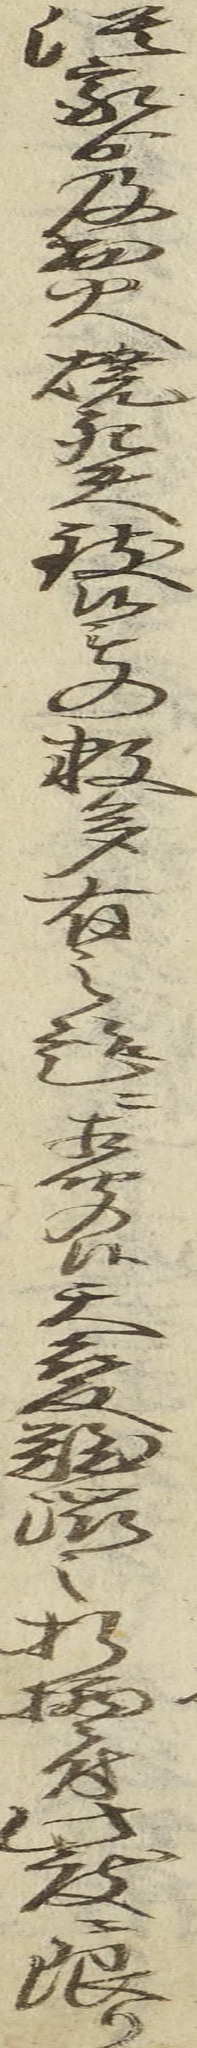潰家ゟ及出火焼死失致候もの数多有之趣ニ相聞候天変難渋之折柄ニ付此度ニ限り
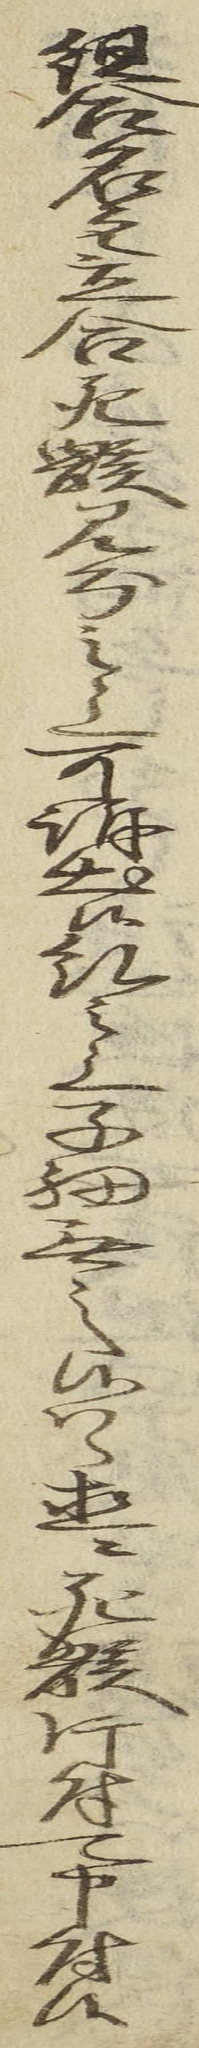組合名主立合死骸見分之上可訴出候糺之上子細無之候はゝ直ニ死骸片付可申付候
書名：安政二年震災記事　完
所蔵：東京大学地震研究所図書室 Earthquake Research Institute Library, The University of Tokyo, JAPAN
